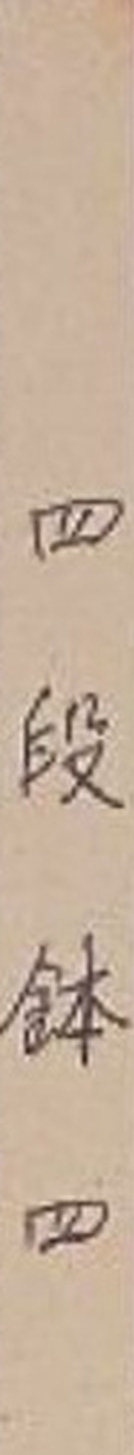四段鉢四

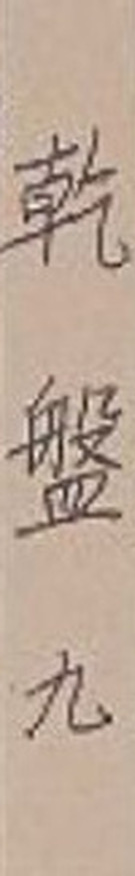乾盤九

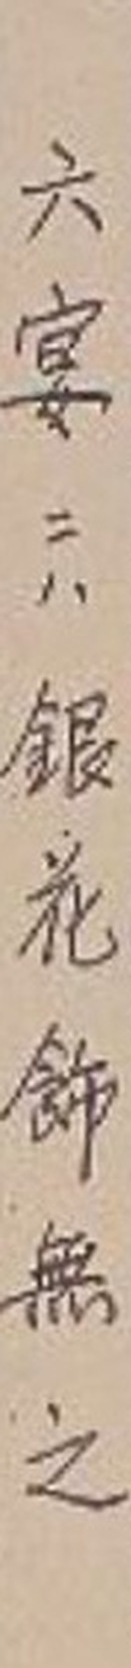六宴には銀花飾無之
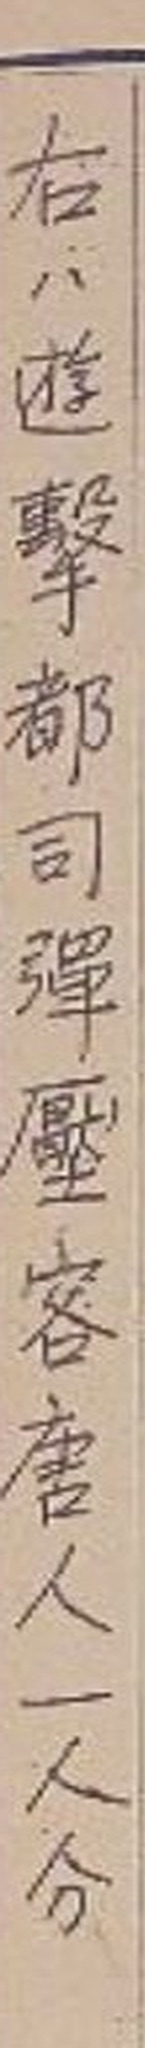右は遊撃都司弾圧客唐人一人分
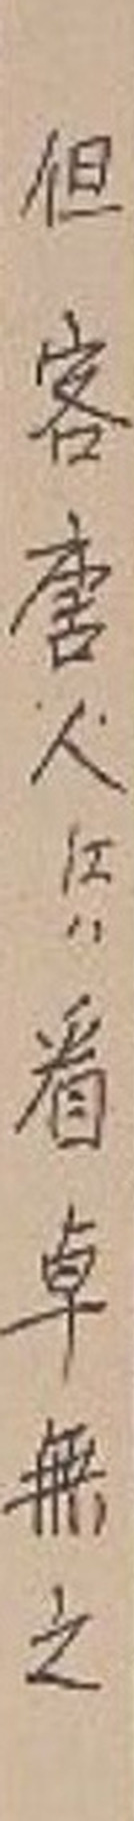但客唐人えは看卓無之
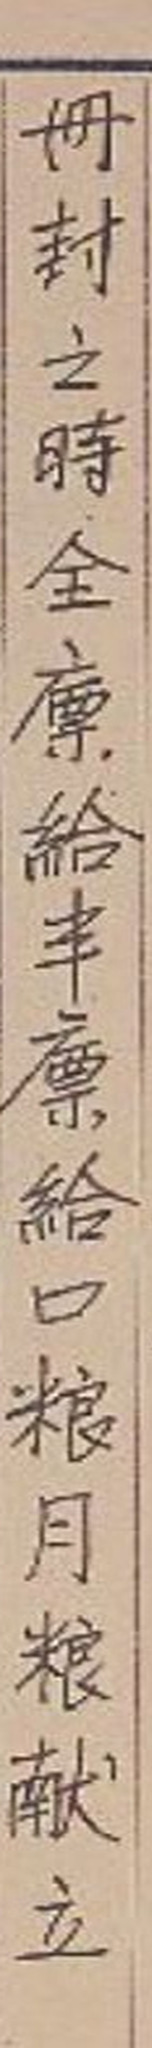冊封之時全廩給半廩給口粮月粮献立
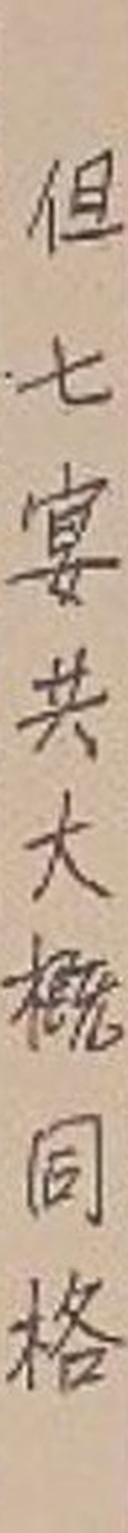但七宴共大概同格
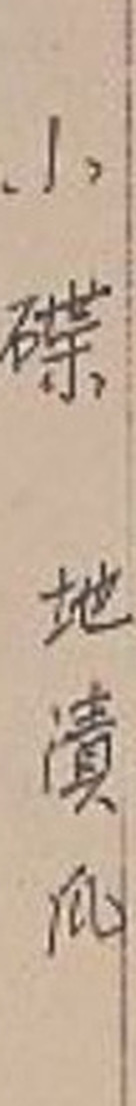小碟地漬瓜
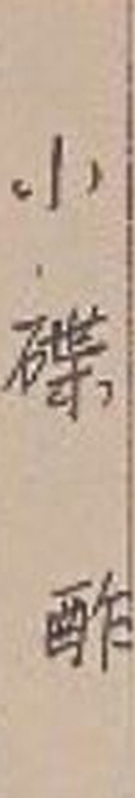小碟酢
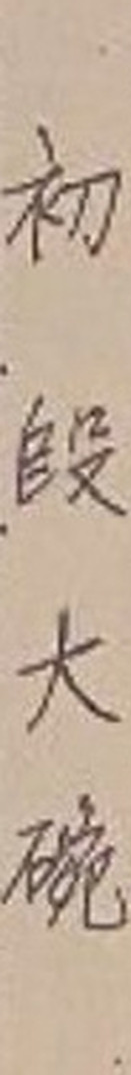初段大碗
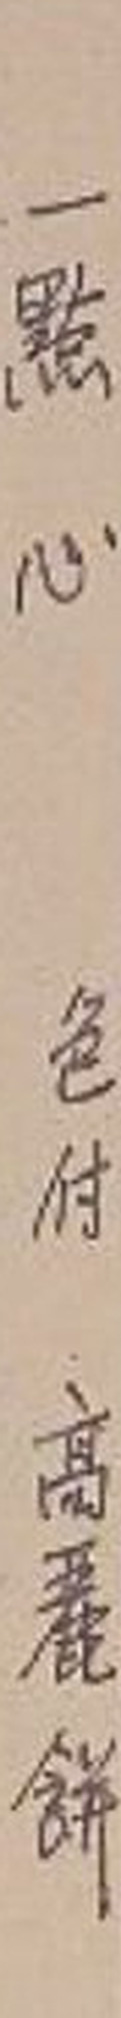一点心色付高麗餅

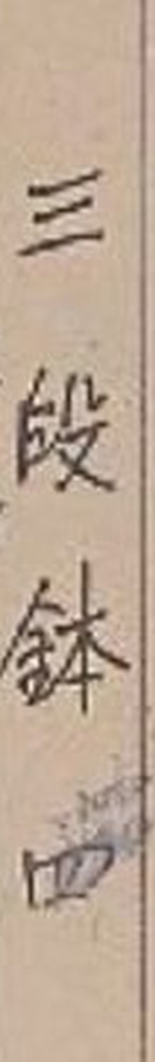三段鉢四
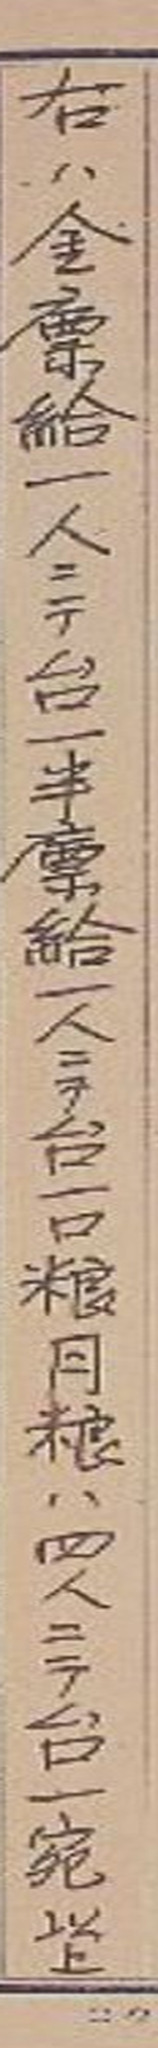右は金廩給一人にて台一半廩給一人にて台一口粮月粮は四人にて台一宛以上
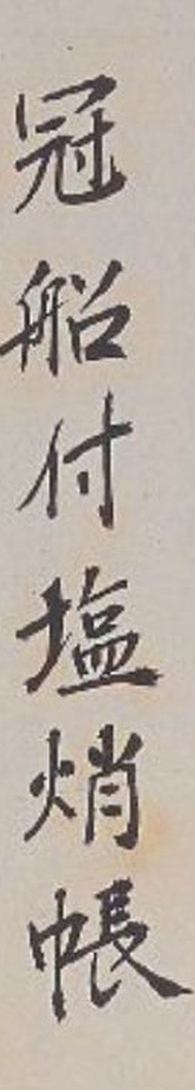冠船付塩硝帳

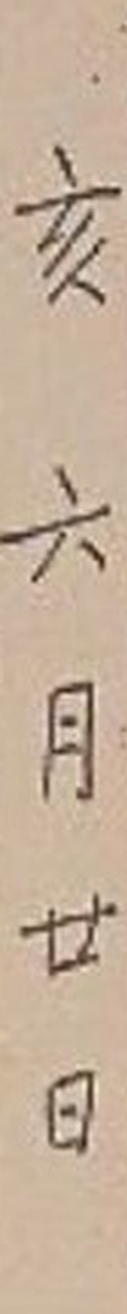亥六月廿日
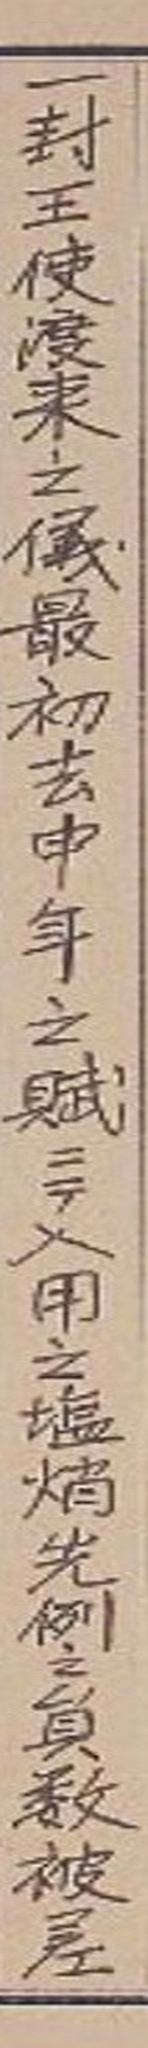一封王使渡来之儀最初去申年之賦にて入用之塩硝先例之員数被差
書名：支那冊封使来琉諸記 下巻
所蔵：University of the Ryukyus Library
